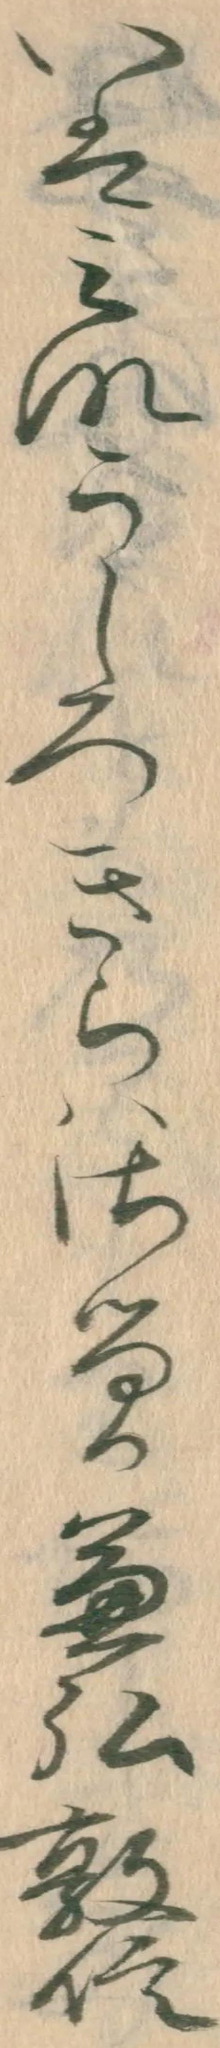いはみなうしろきらはさるか兼弘敦信
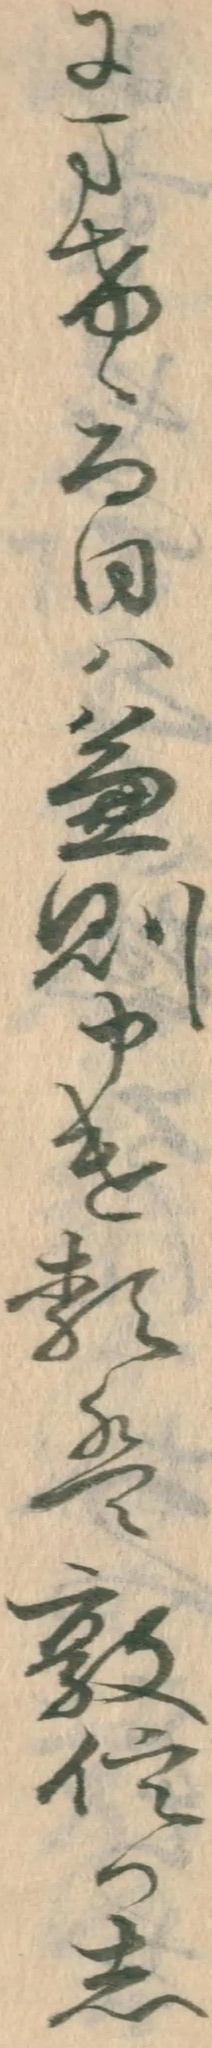にまけゝる日は兼則申けるはは敦信かし
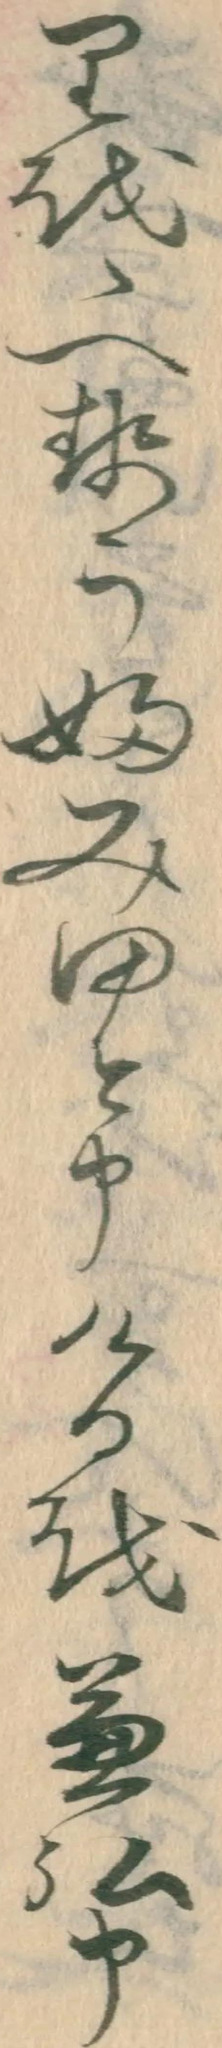りをゝへせうふみゆと申けるを兼弘申
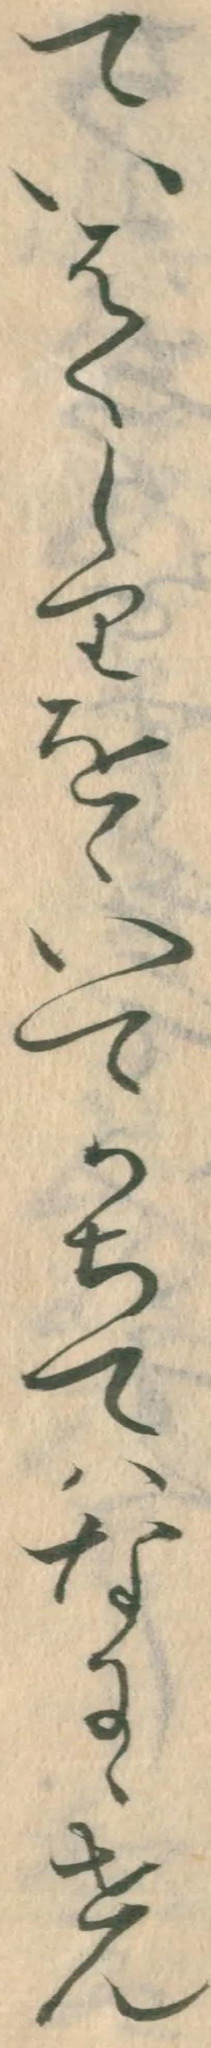ていはくしりをゝいてかちてはなにゝせん
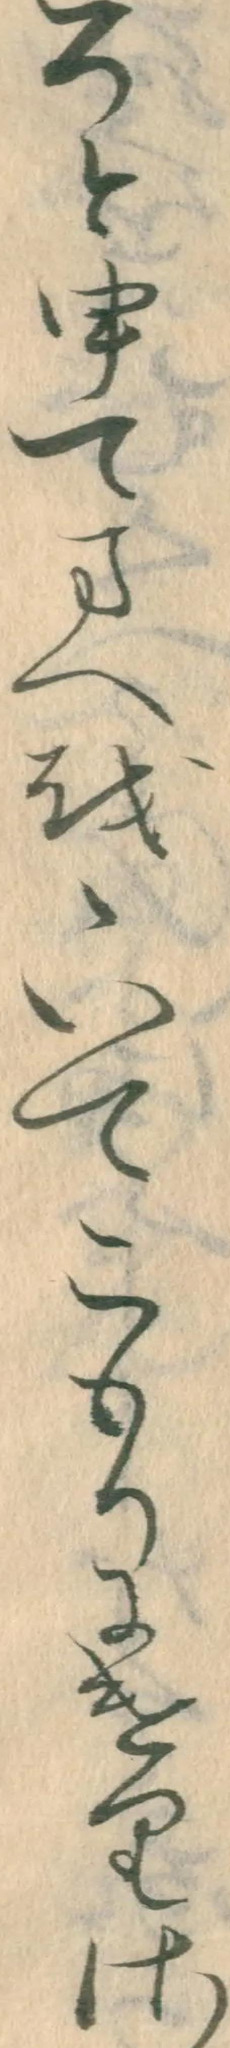そと申てまへをゝいてこもりにけりさ
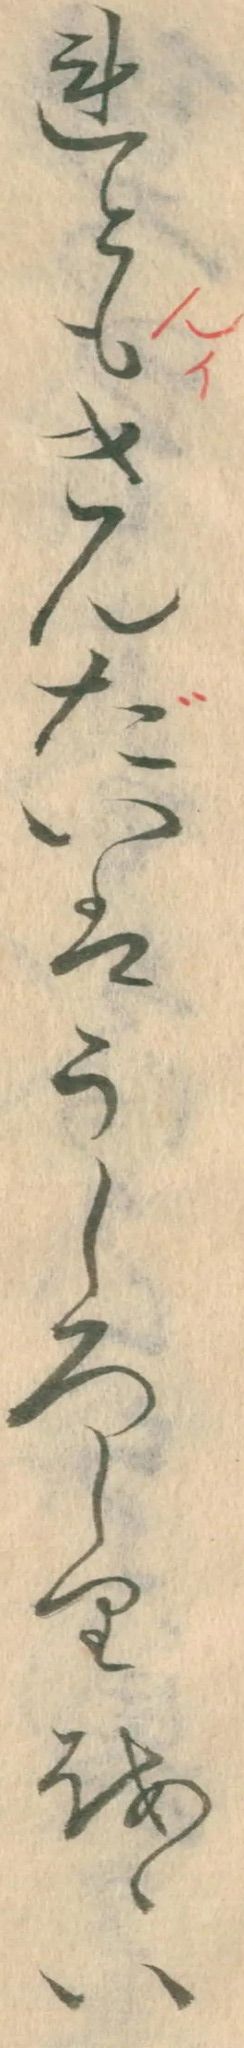れともきんたいはうしろしりをゝい
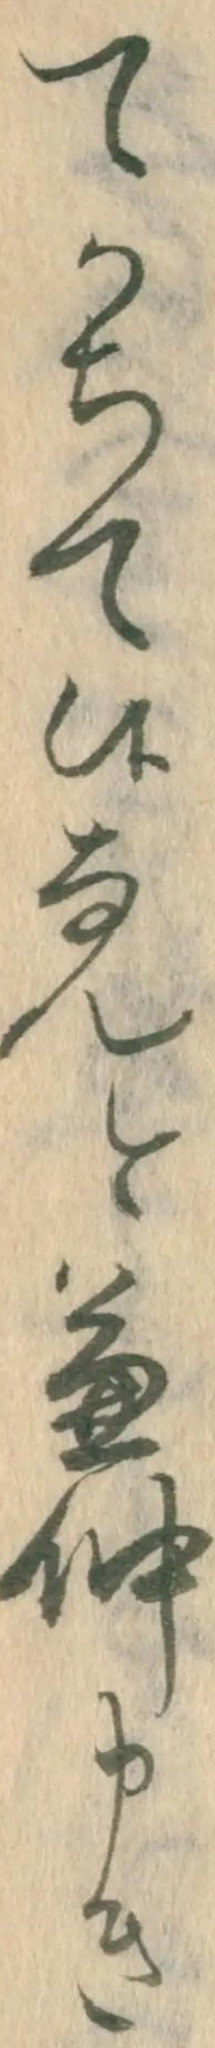てかちて候なんと兼仲申き

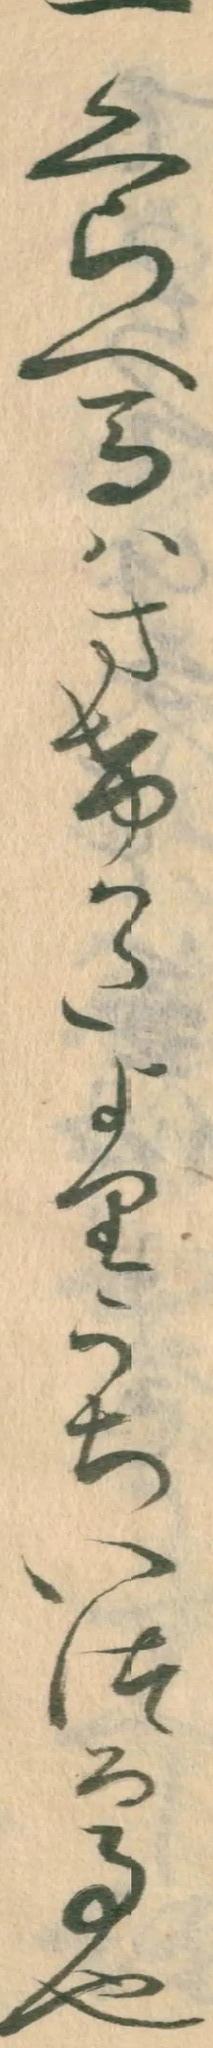一くらへ馬はまけかたよりうちいつる事也
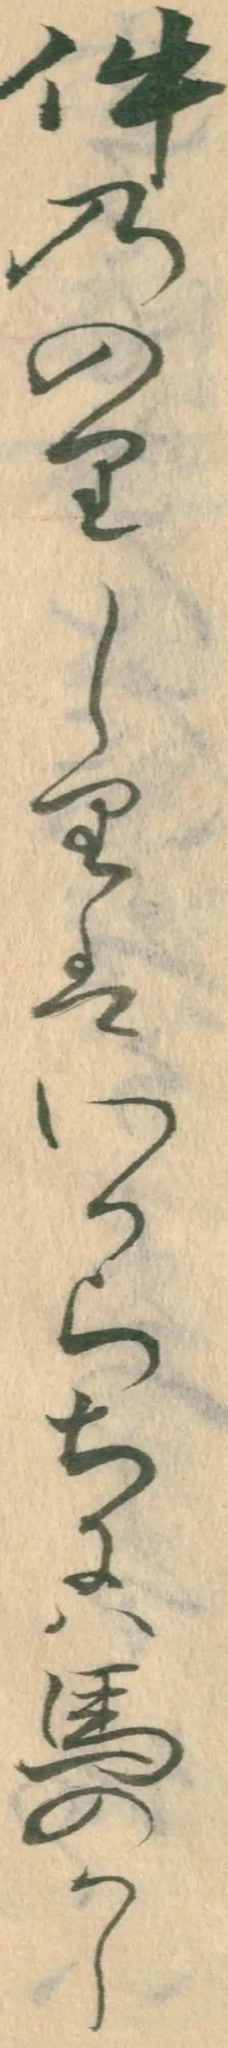件ののりしりはわからちには馬のかし
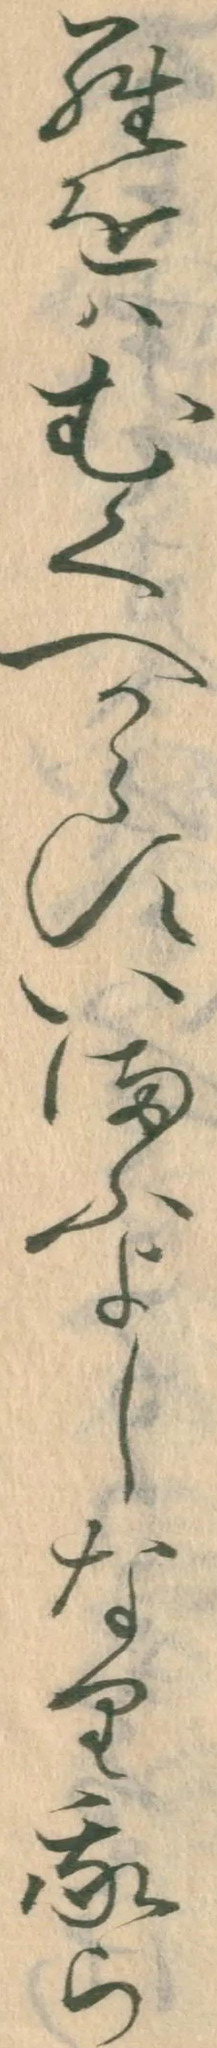らをはむくへからすいまふよしなり我ら
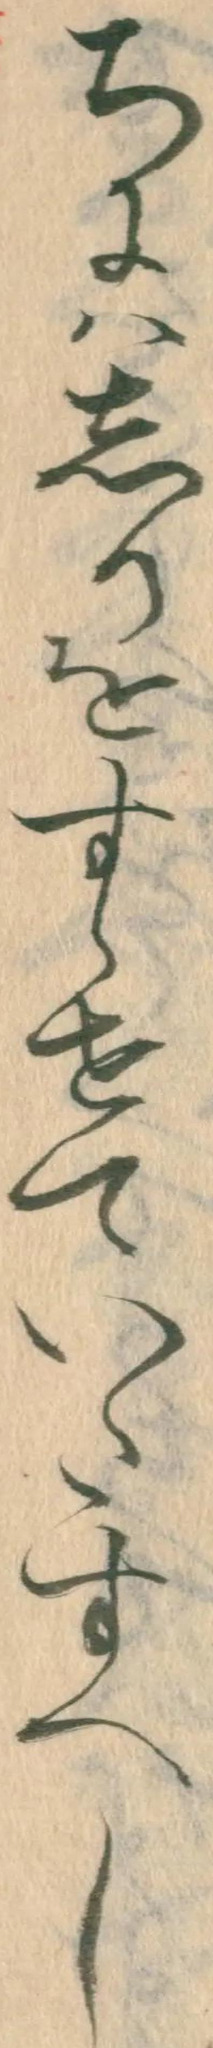ちにはしりをすらせていたすへし
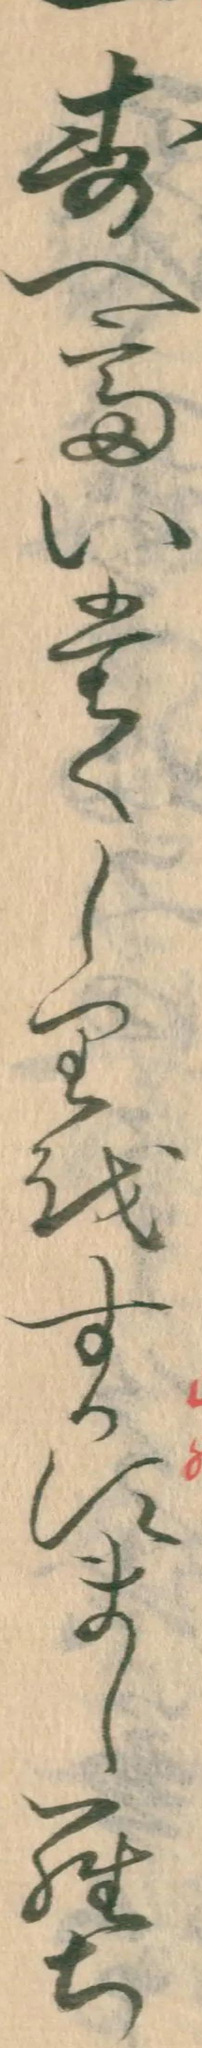一すへていたくしりをすかすましらち
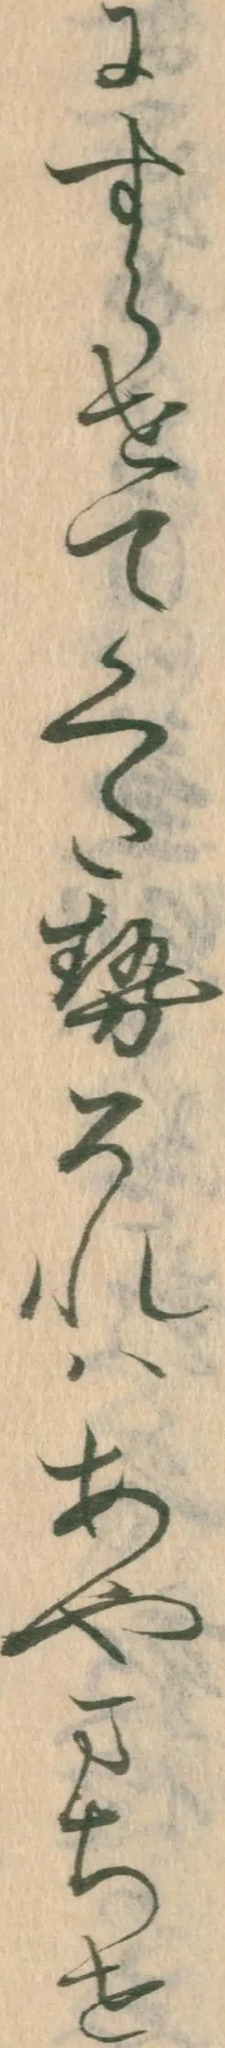にすらせてくたせそれはあやまちせ
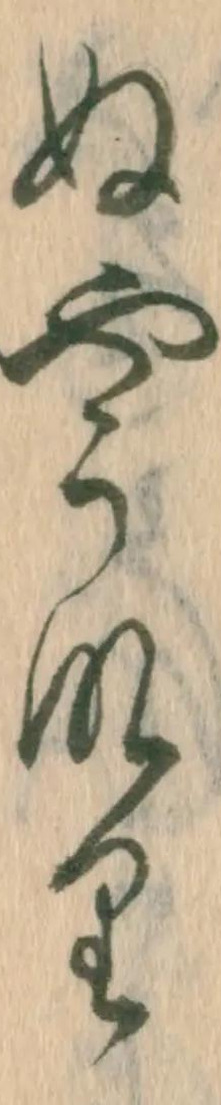ぬやうなり
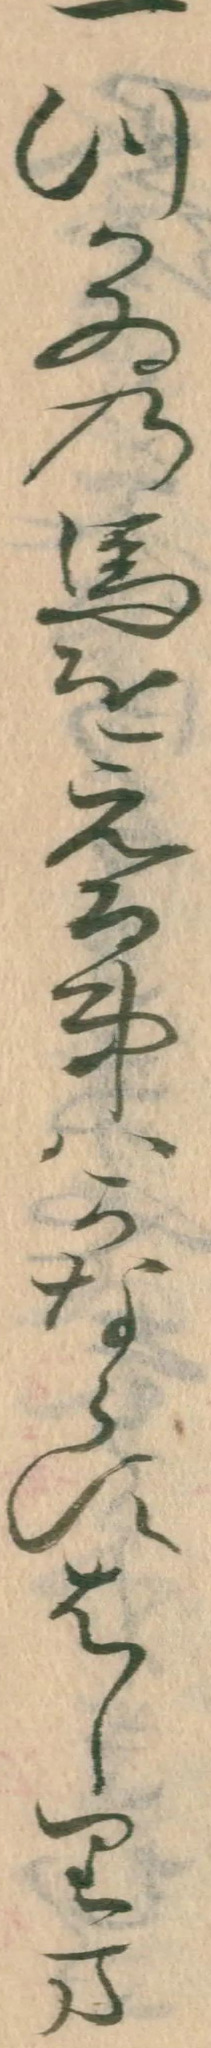一つかゐの馬をえる事はかならすはしりま
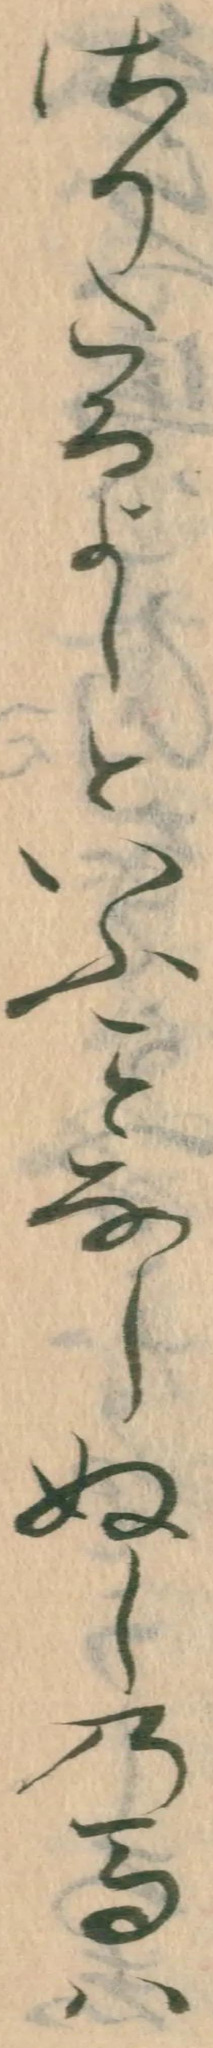さりたるよしといふことなしぬしの馬は
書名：賀茂社記録. 第13冊
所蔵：国立国会図書館 National Diet Library, JAPAN
